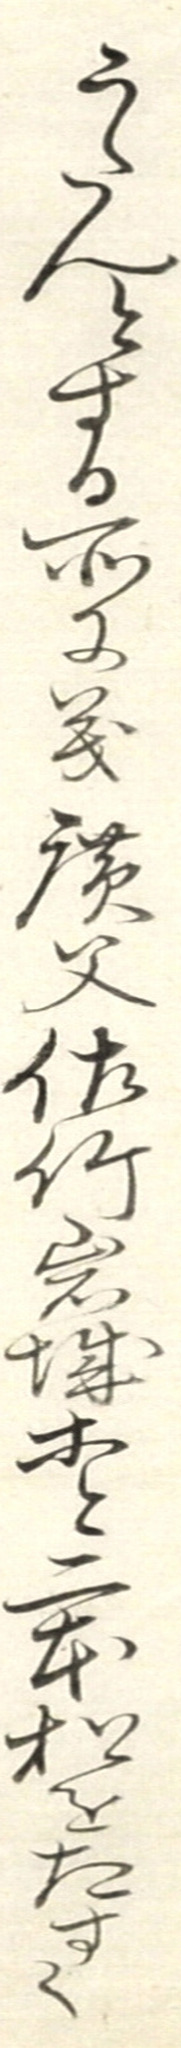うたんとする所に義広父佐竹岩城等と二本松をたすく
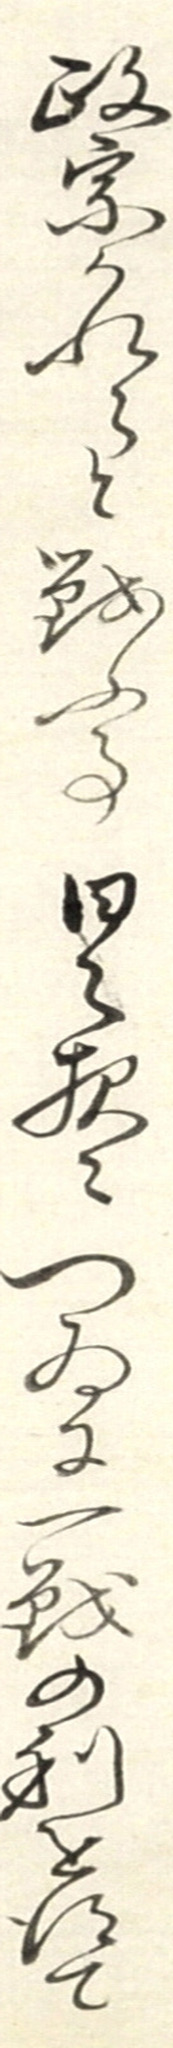政宗かれらと戦ふ事日々夜々つゐに一戦の利を得て
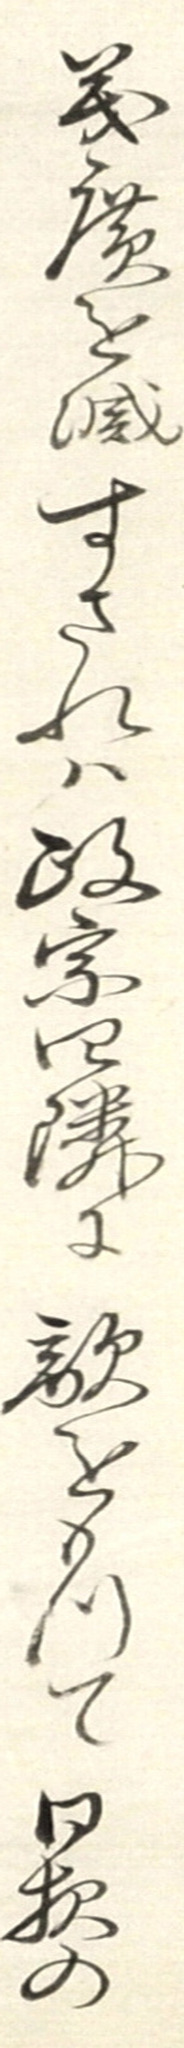義広を滅すされは政宗四隣に敵をもつて日夜の
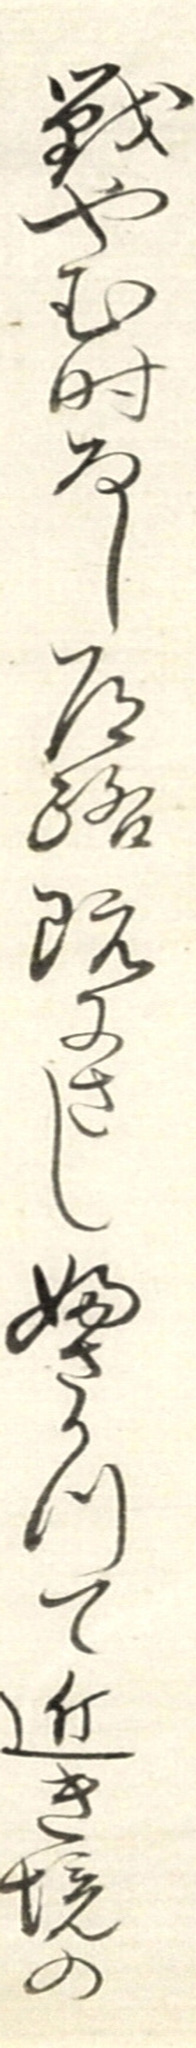戦やむ時なし道路既にさしふさかつて近き境の
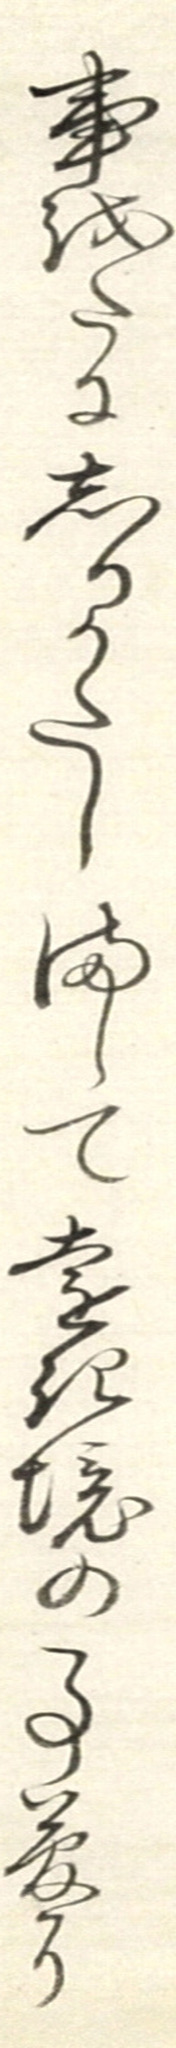事をたにしりかたしまして遠き境の事爰に
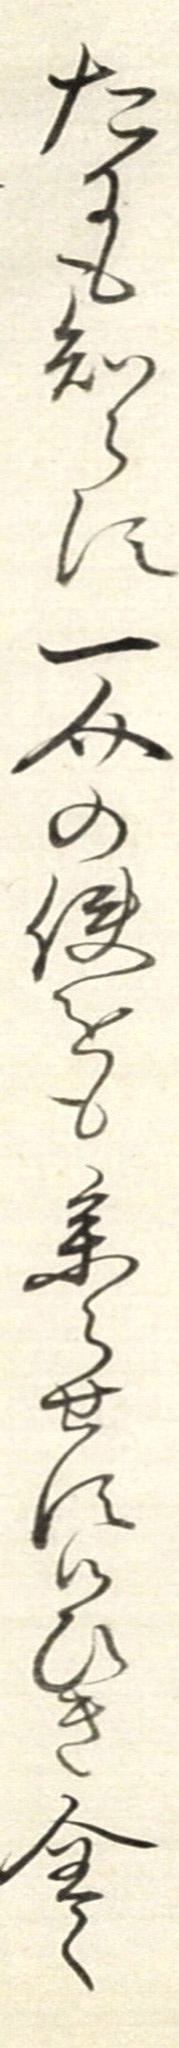たにも知らす一介の使をも参らせす候ひき全く
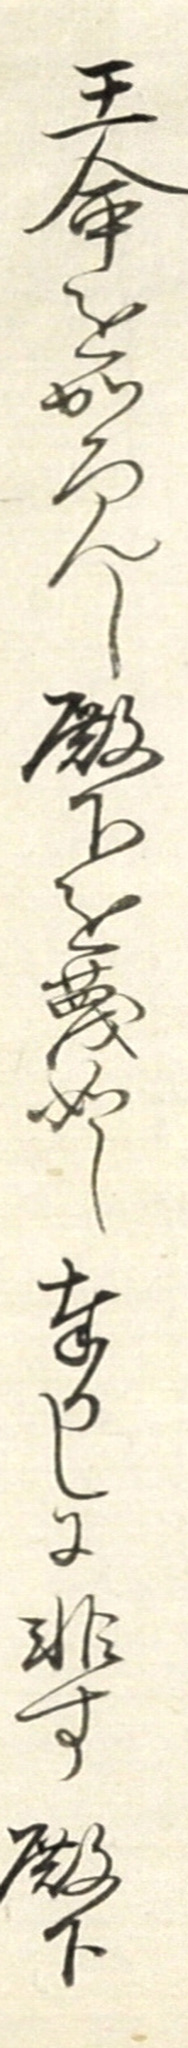王命をかろんし殿下を蔑如し奉りしに非す殿下
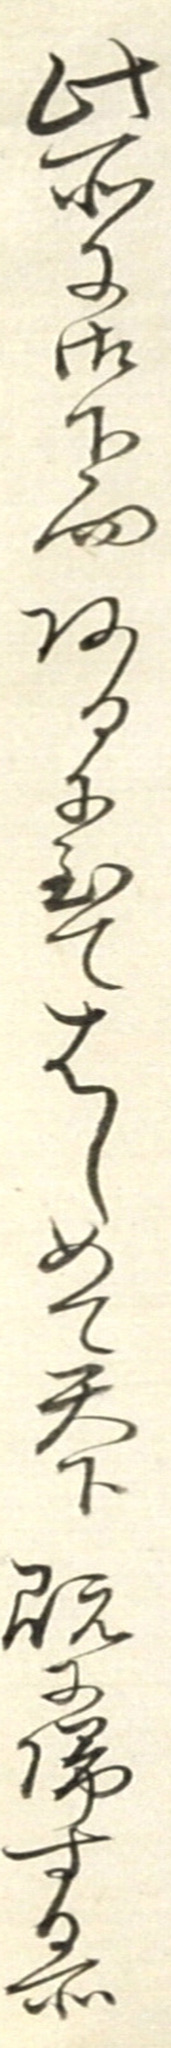此所に御下向あるに至てはしめて天下既に帰する所
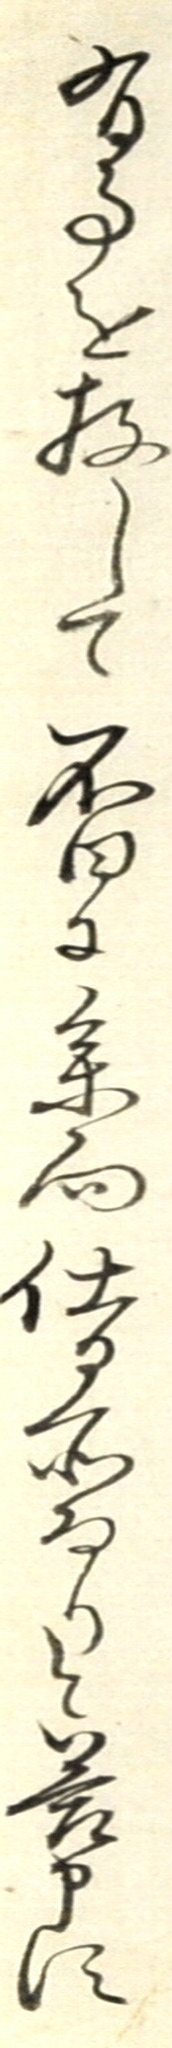有事を存して不日に参向仕る所なりと答申す

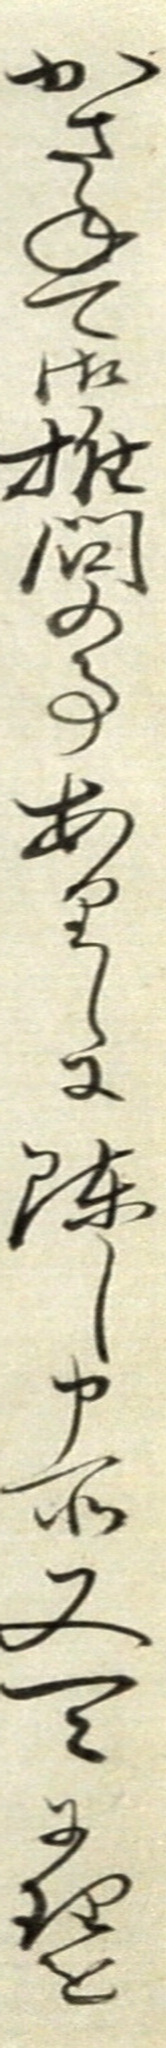かさねて御推問の事ありしに陳し申所又天に理を
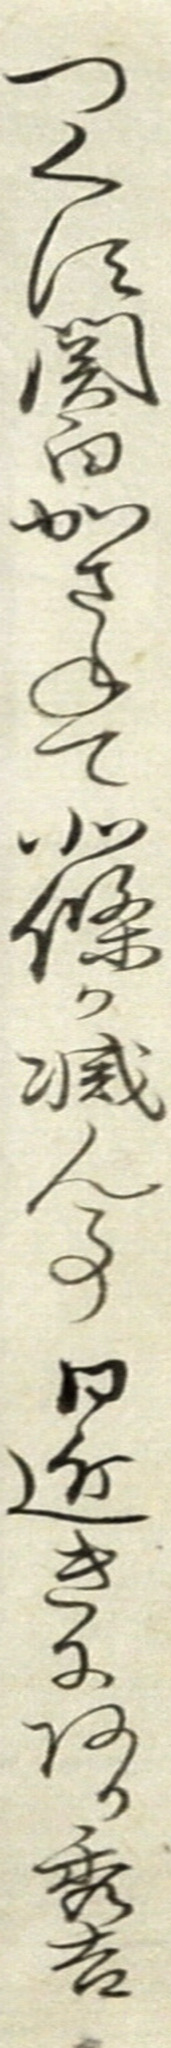つくす関白かさねて北条か滅ん事日近きにあり秀吉
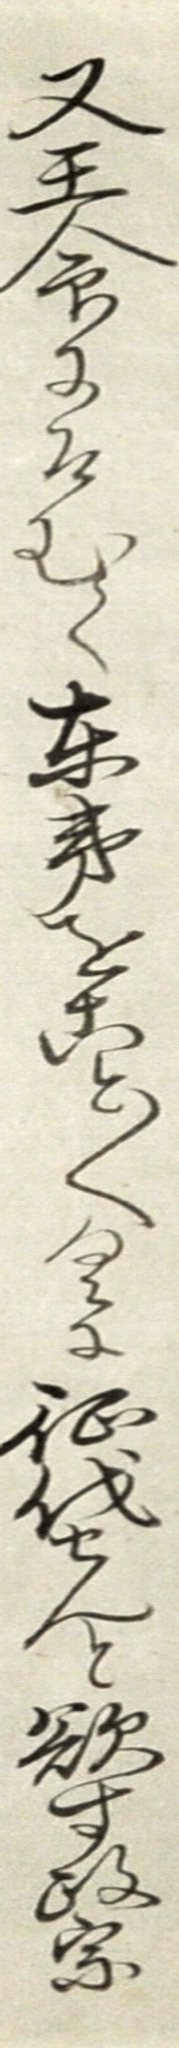又王命にそむく東夷をこと〳〵くに征伐せんと欲す政宗
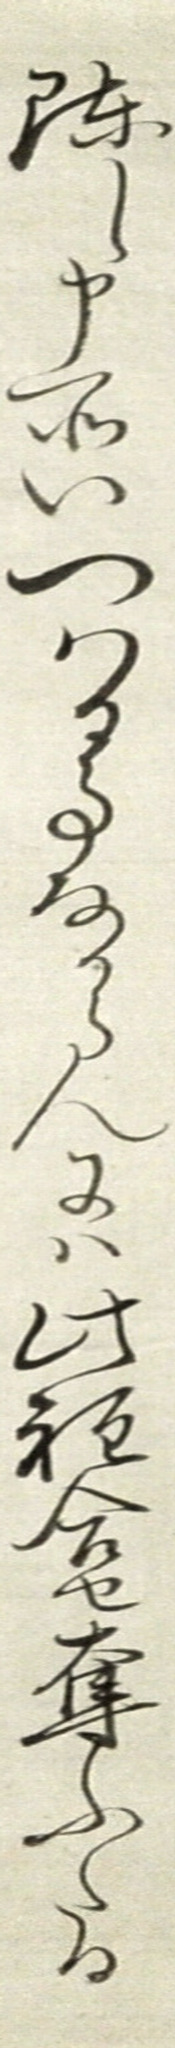陳し申所いつはる事なからんには此程合せ奪ふたる
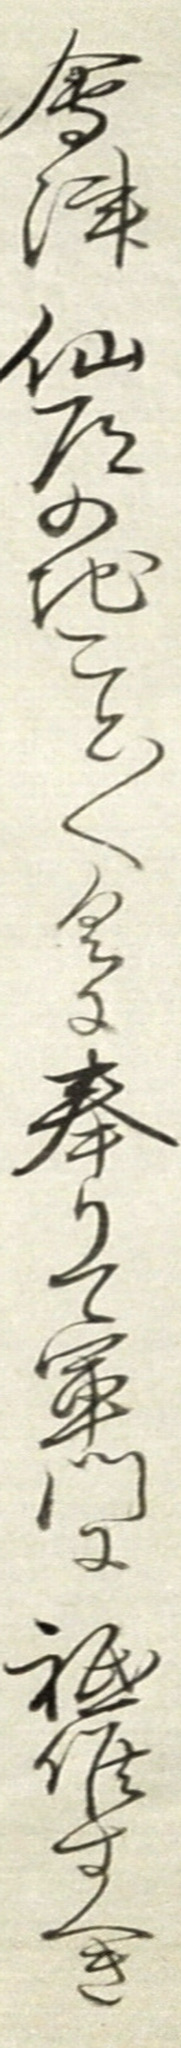会津仙道の地こと〳〵くに奉りて軍門に祗候すへき
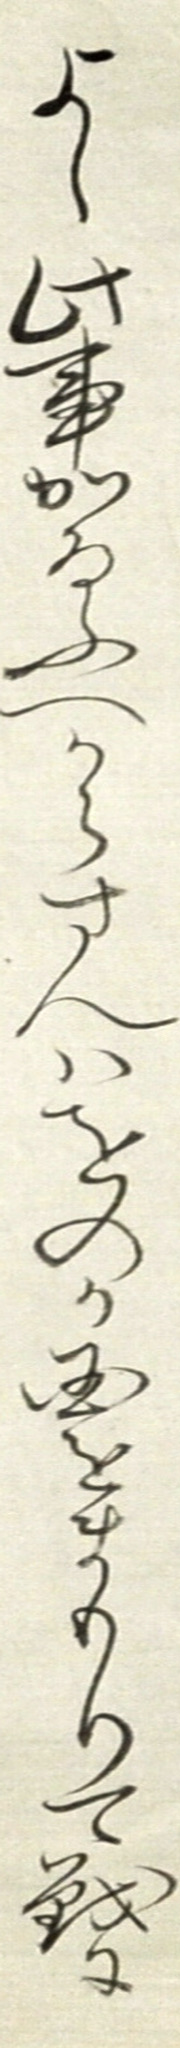よし此事かなふへからすんはをのか国をまもりて戦に
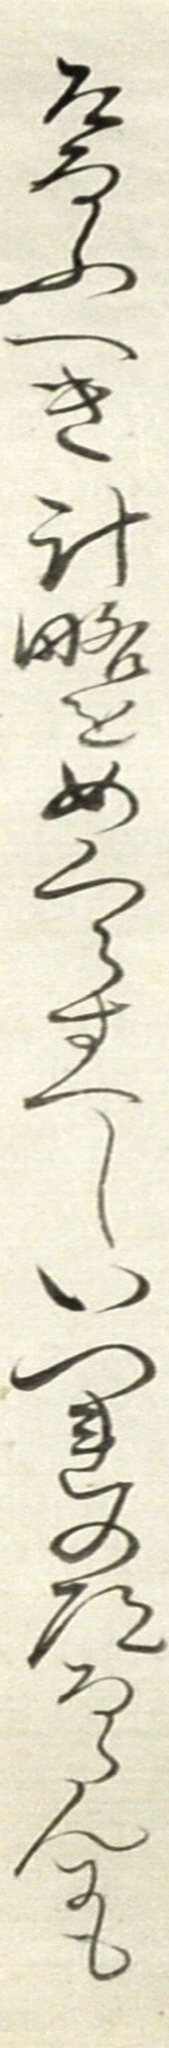そなふへき計略をめくらすへしいつれの道ならんにも
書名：藩翰譜（七・下）
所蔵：伊那市立高遠町図書館・合同会社AMANE
